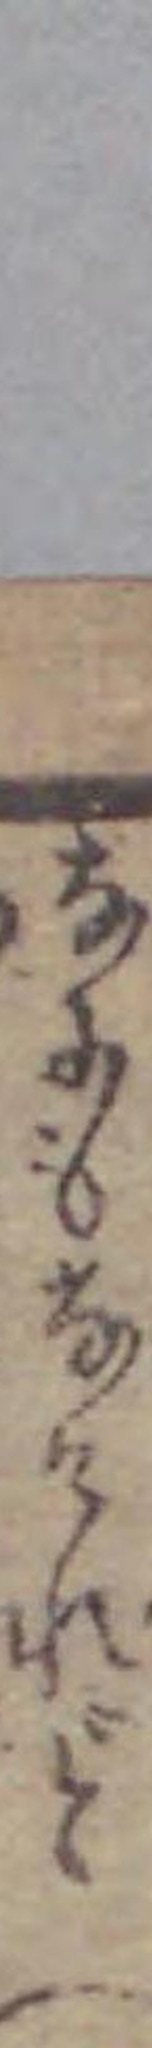なにもなけれど
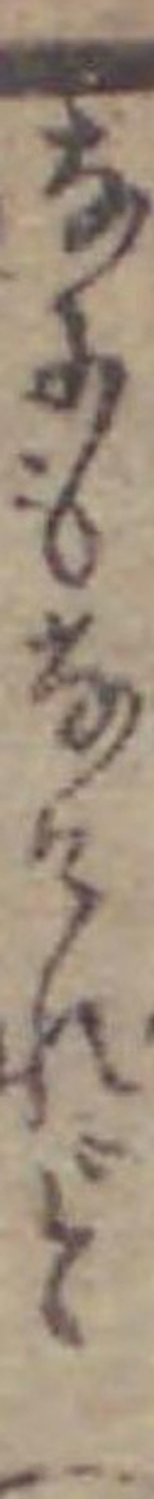なにもなけれど
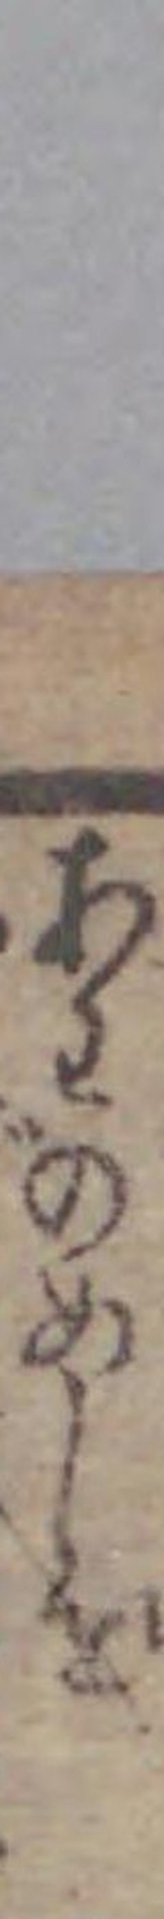あわのめしを
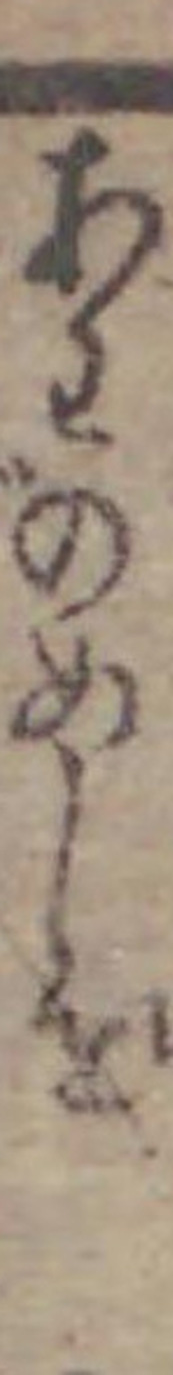あわのめしを
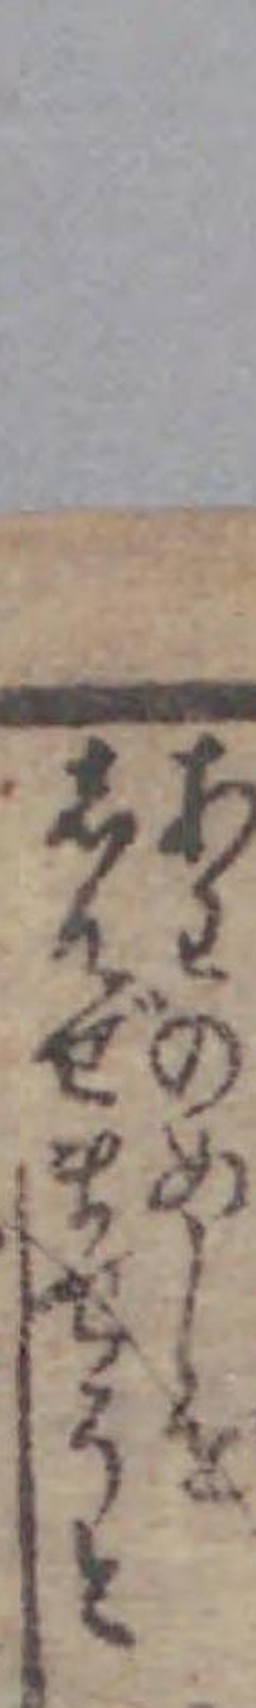しんぜませうと
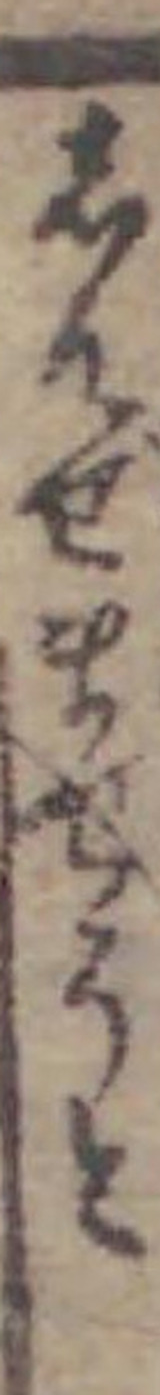しんぜませうと
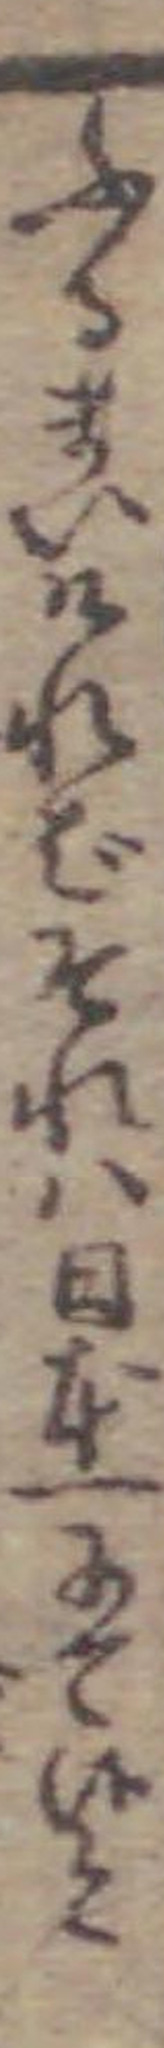ふるまいければそれは日本一にて候と
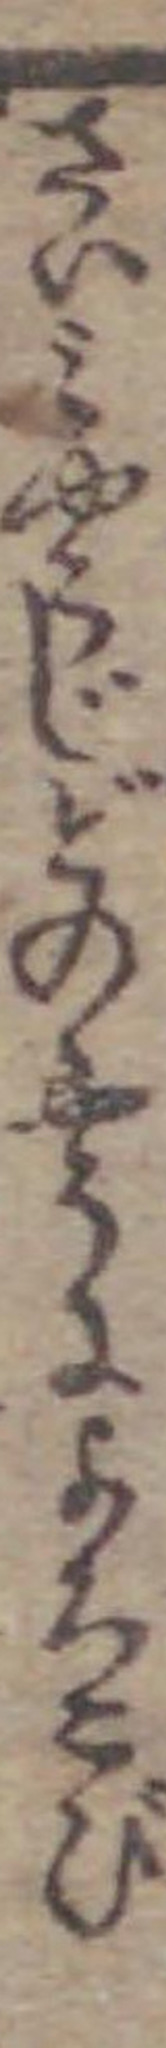さいみやうじどのゝやうによろこび
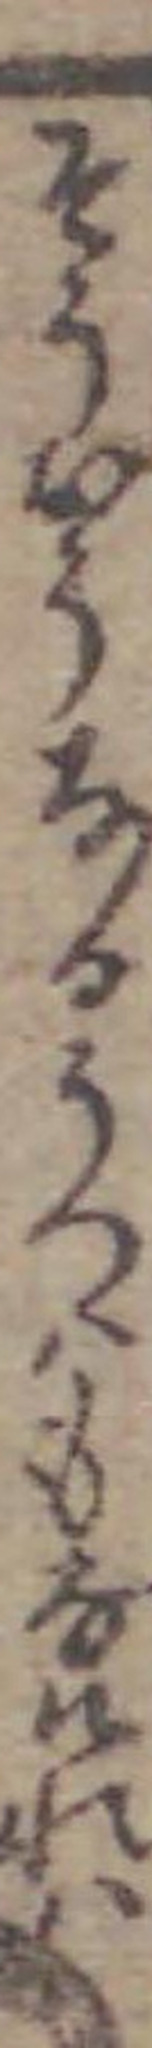そうおうなるうつはもなけれは
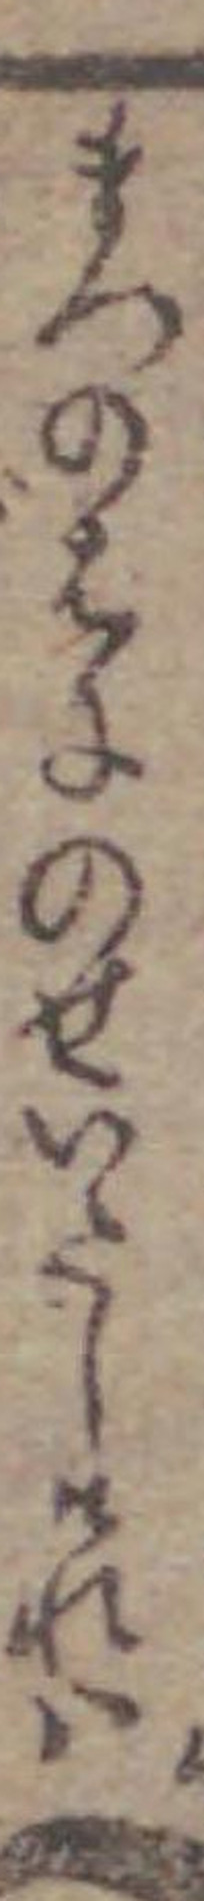まつのはにのせいたしけれは
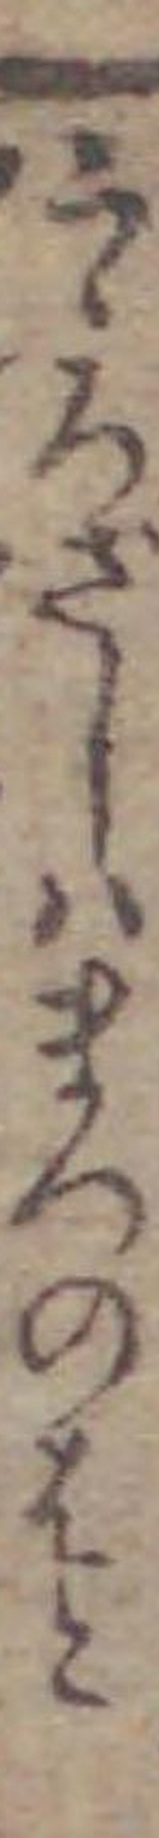こゝろざしはまつのはと
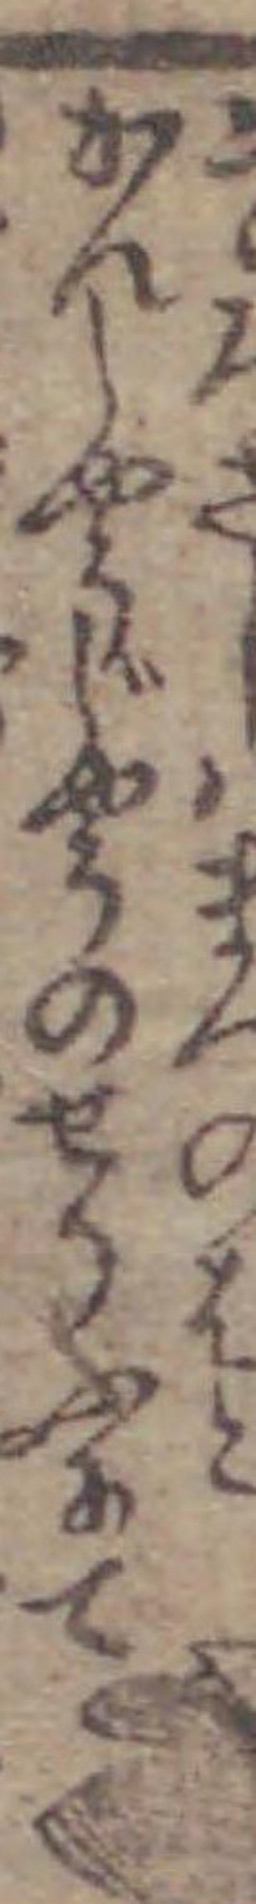かんしやうじやうのせりふにて
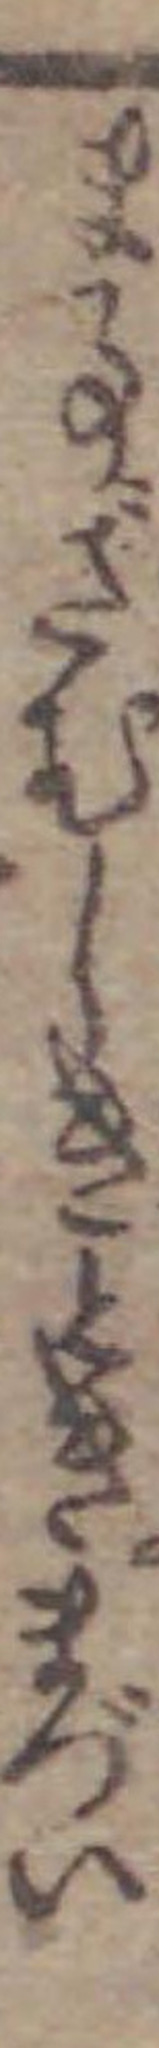ま事にさむしきときまづい
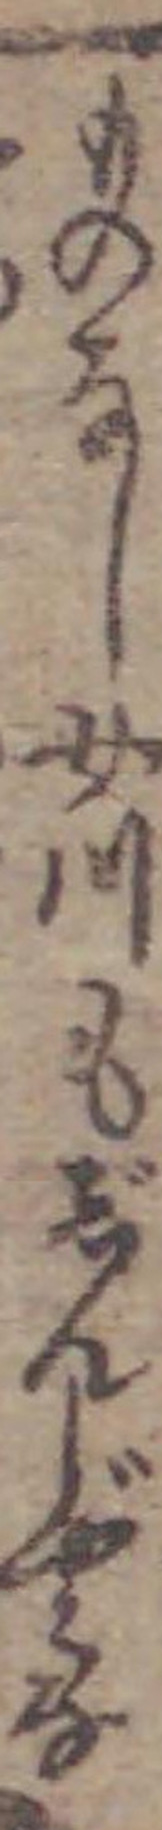ものなし女川もじんじやうな
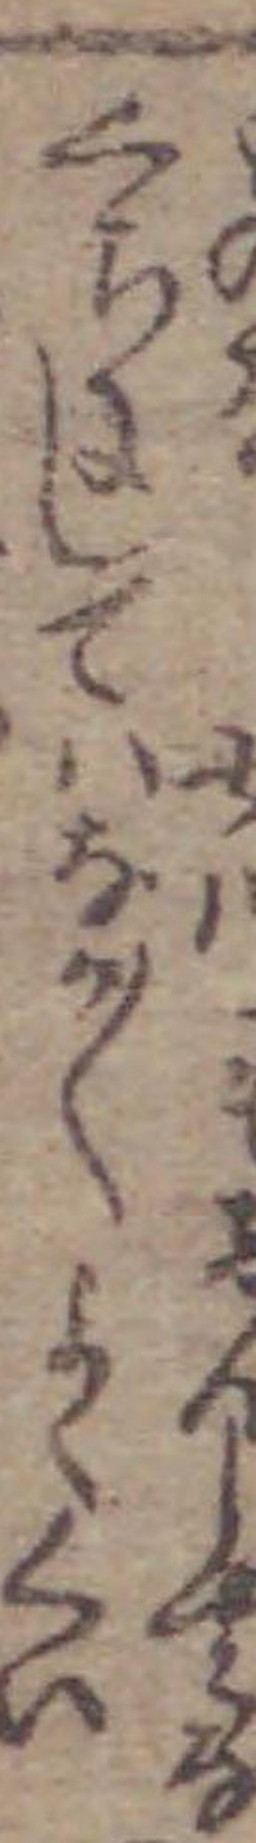くちにしてはなか〳〵よくくい
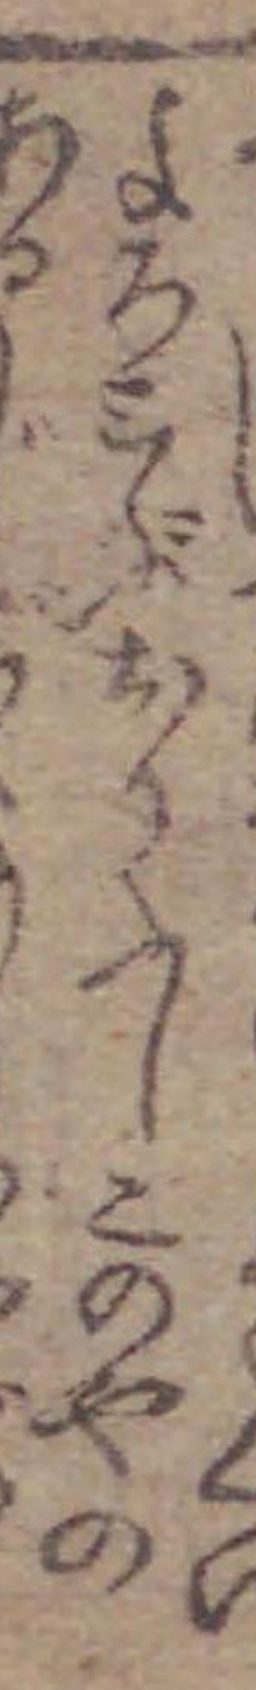よろこぶおりふしこのやの
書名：諸事米の飯 : 3巻
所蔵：国立国会図書館 National Diet Library, JAPAN
